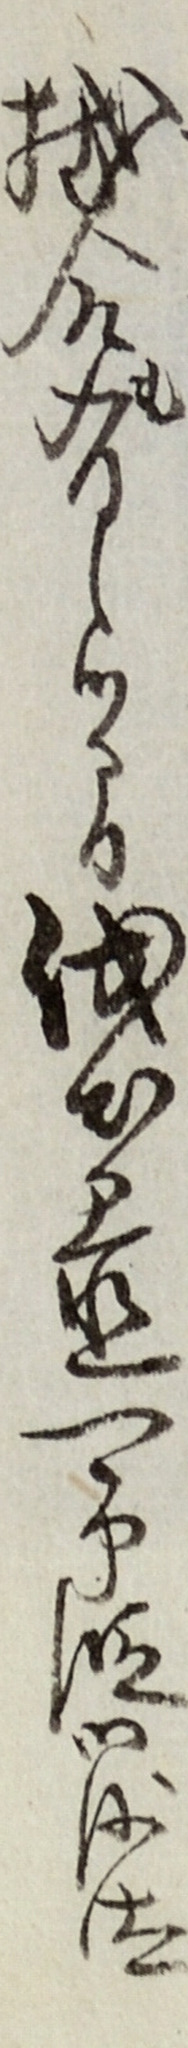掛合も有之候間伐出置可申段御沙汰
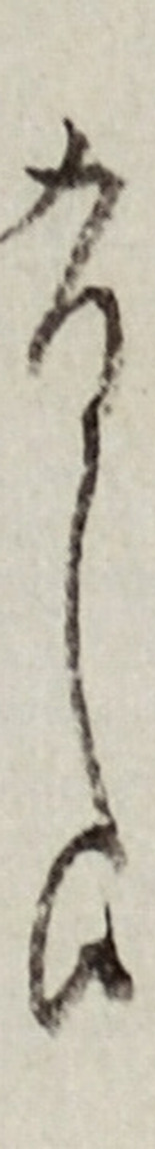有之候
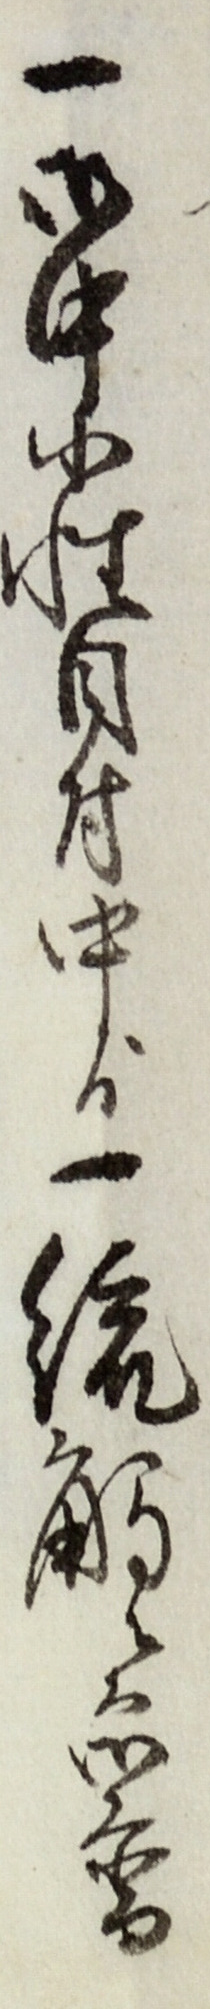一御中小性目付中ゟ一統触ニ而御普
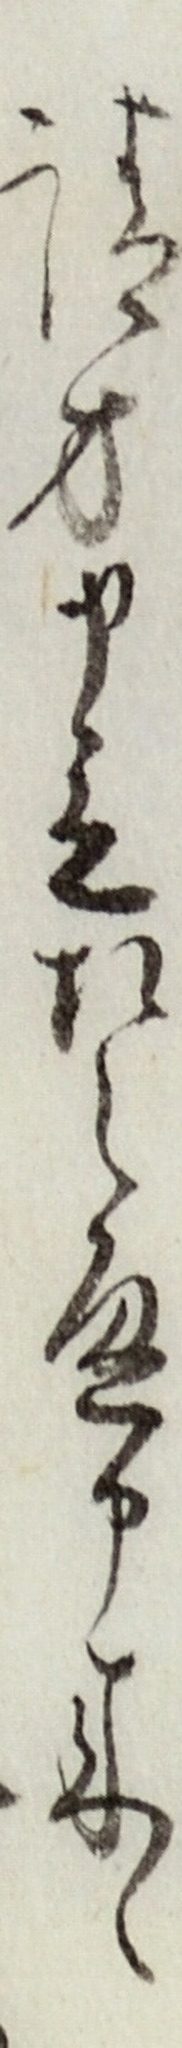請方申立左之通申来候
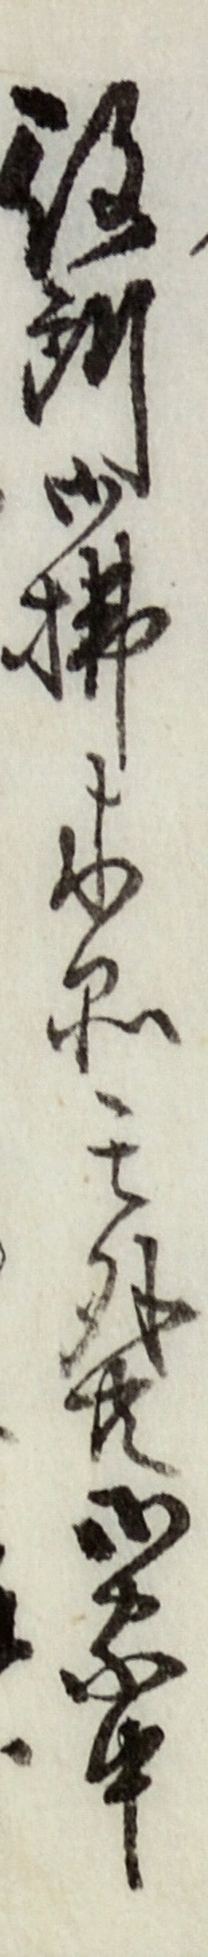役所御払木品其外共御家中
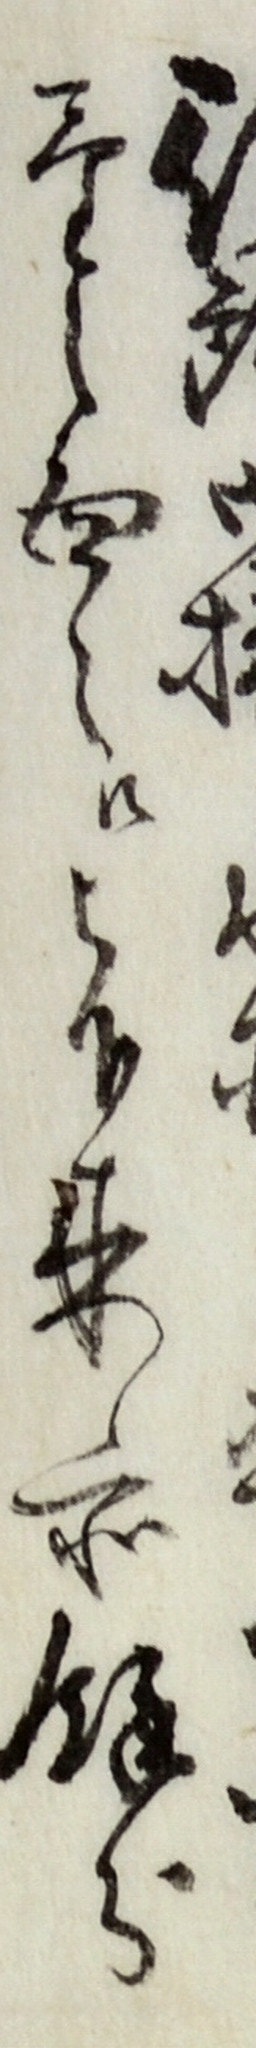望之面々江被下来候所余分

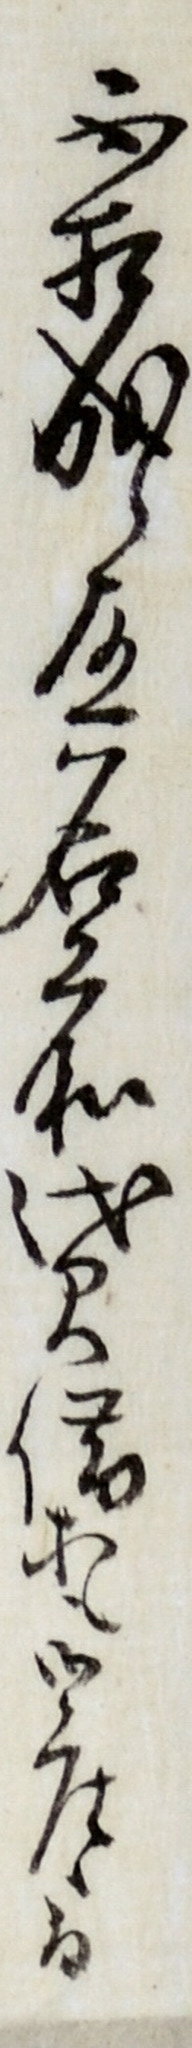不相成候故名前貸借等も御座候間
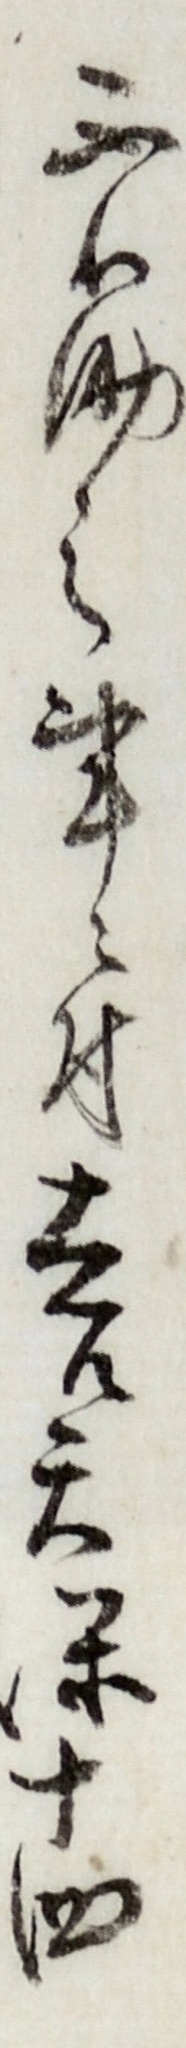不筋之事ニ付去ル天保十四
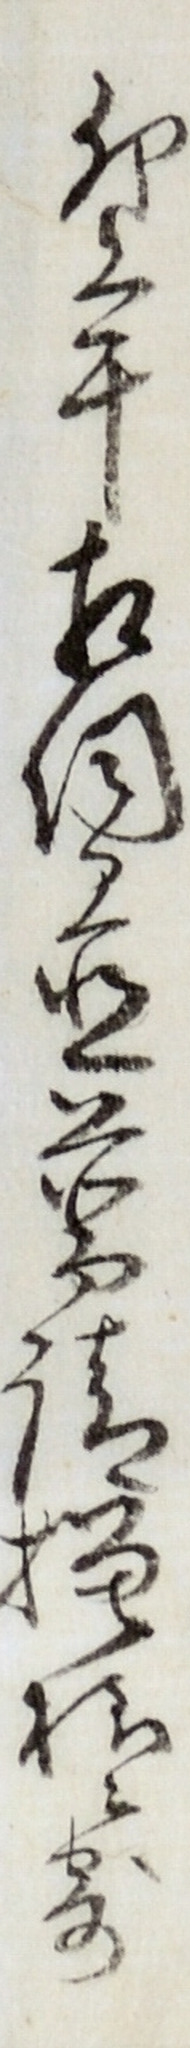卯年相伺置普請模様ニ寄
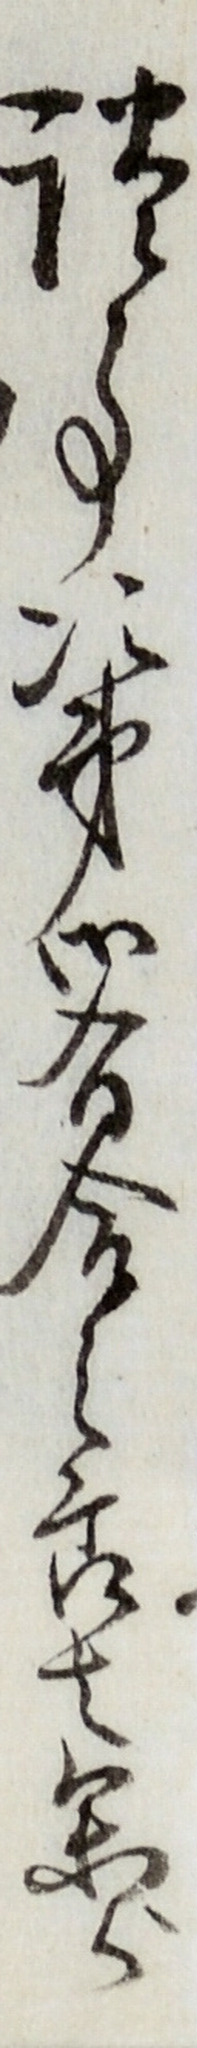談事次第御有合之節者余分
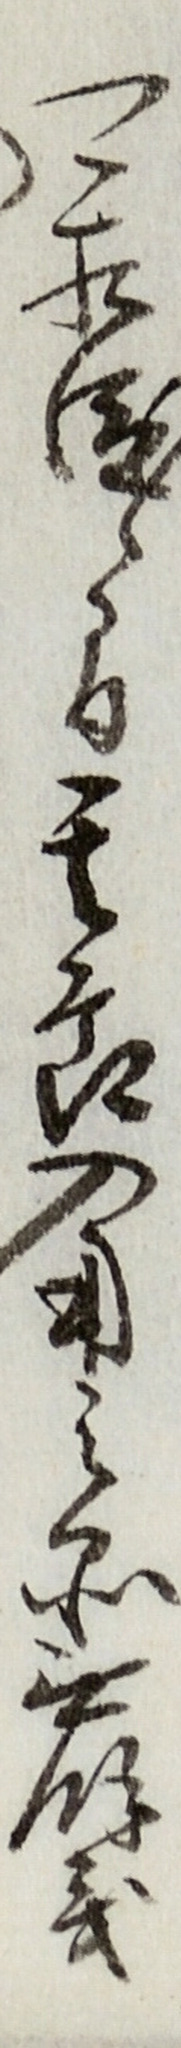可相渡候間其節入用之品無余義
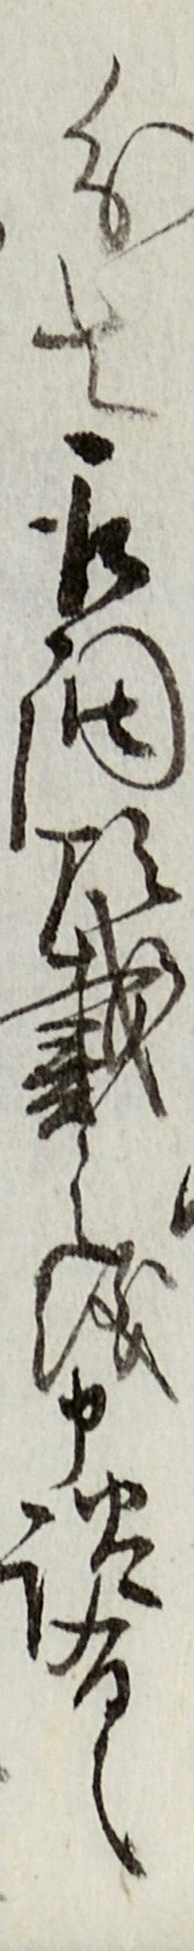分者取調頂戴之儀申談有之
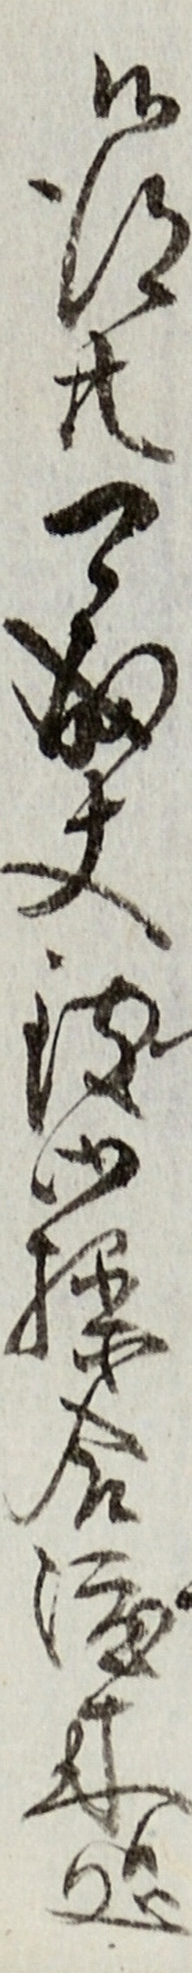候得共可成丈致御操合渡来候処
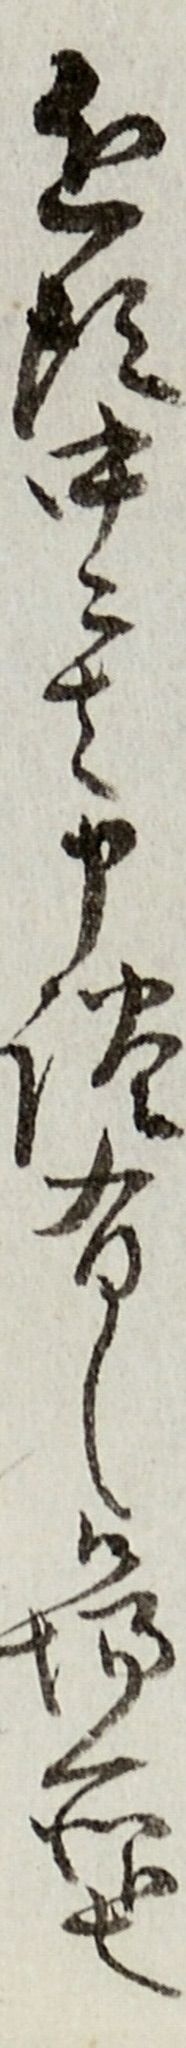近頃中ニ者申談有之候場所江者
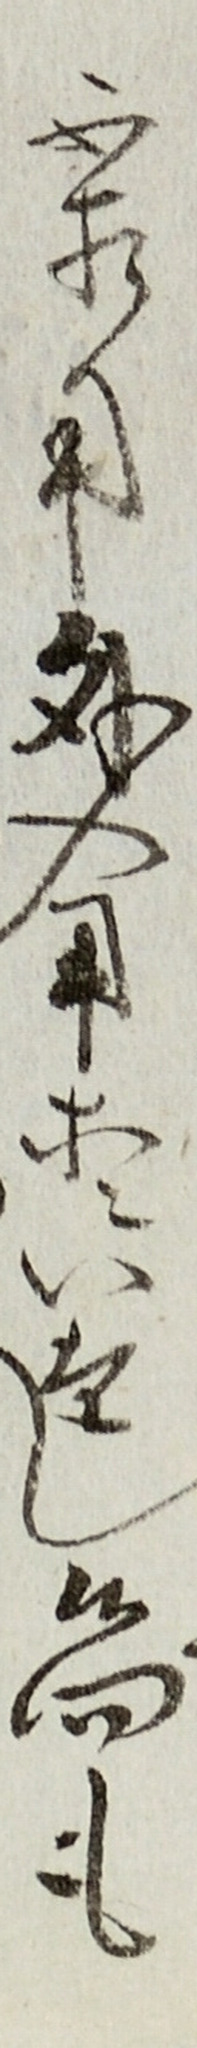不相用外入用等ニいたし候向も
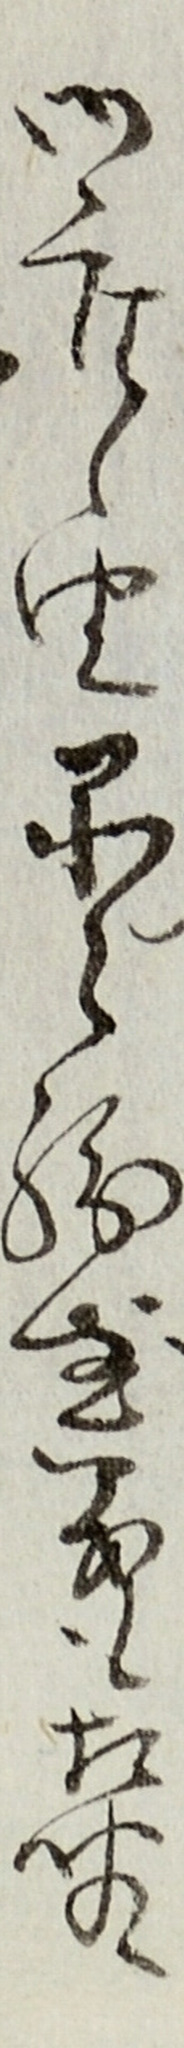御座候由品々紛敷義も相聞候
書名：御山方御薪方諸事御用留
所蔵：伊那市立高遠町図書館・合同会社AMANE
